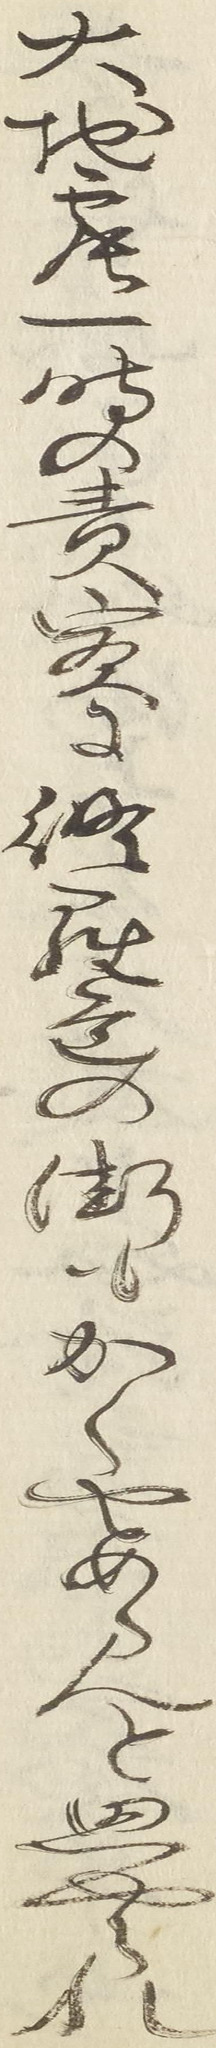大地震一時の責実に修羅道の街もかくやあらんと思やられ
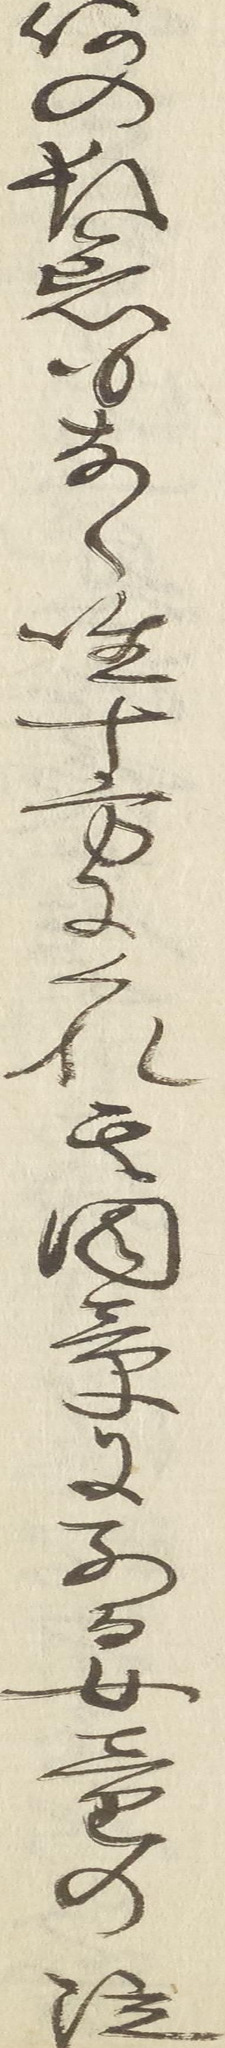何の頓着もなく唯十方にくれ其内爰にある女童の泣
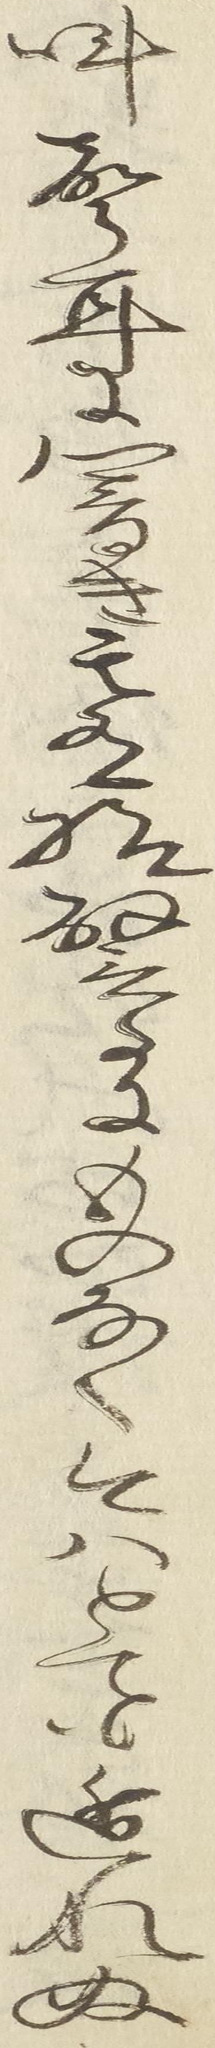叫声耳に響き其有様譬るにものなく今はとても遁れぬ

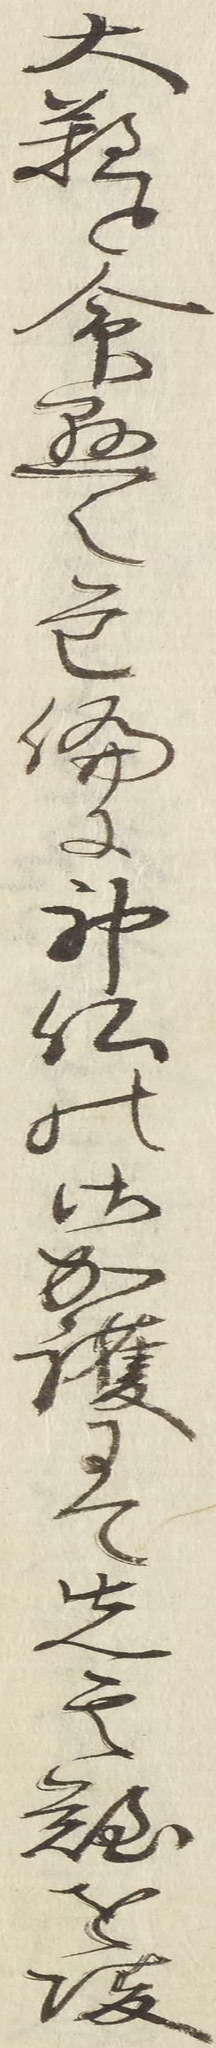大難と命懸の道偏に神仏の御加護にて先其難を凌
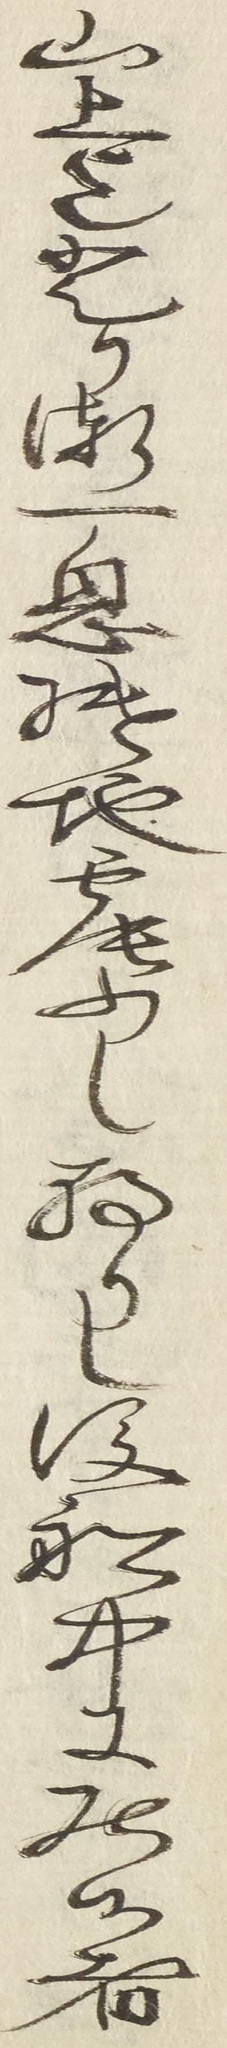山上迄登り漸一息遣継地震少しなりし後船中に居る者
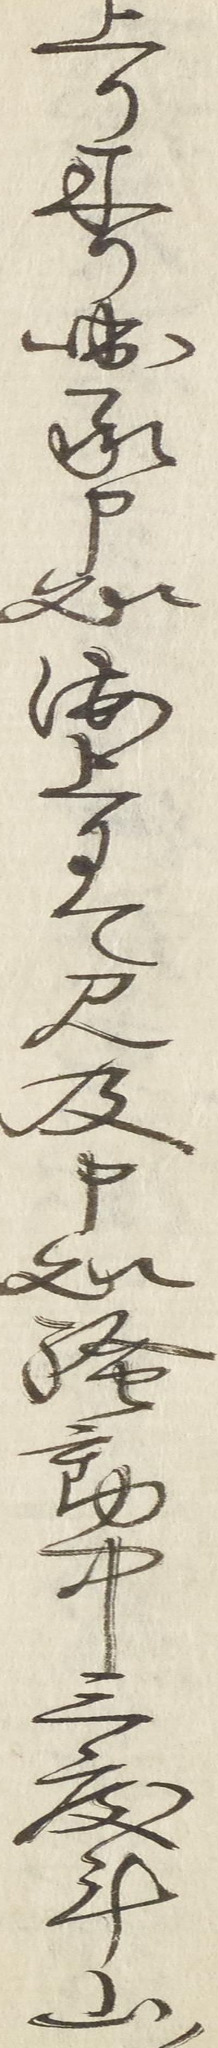上り来り咄承申候処海上にて見及申処騒動中三度斗山ノ
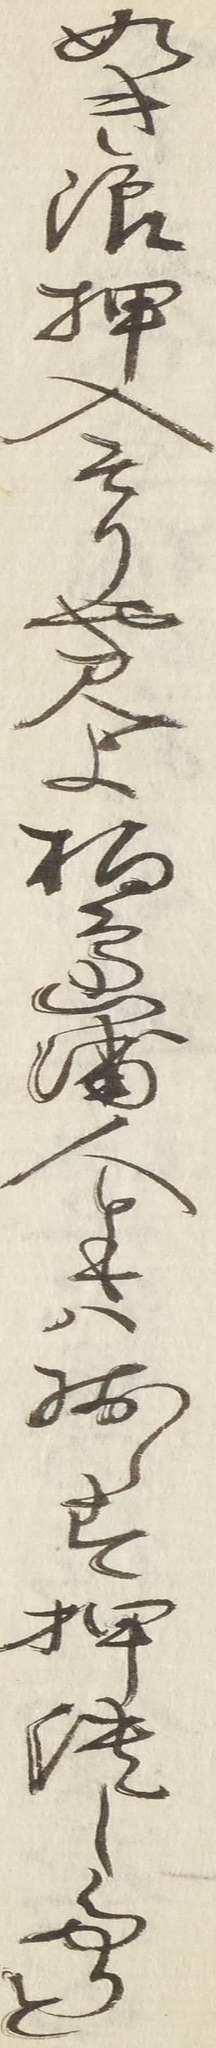如き浪押入そりや見よ柏嶋浦人ともは残らす押流したりと
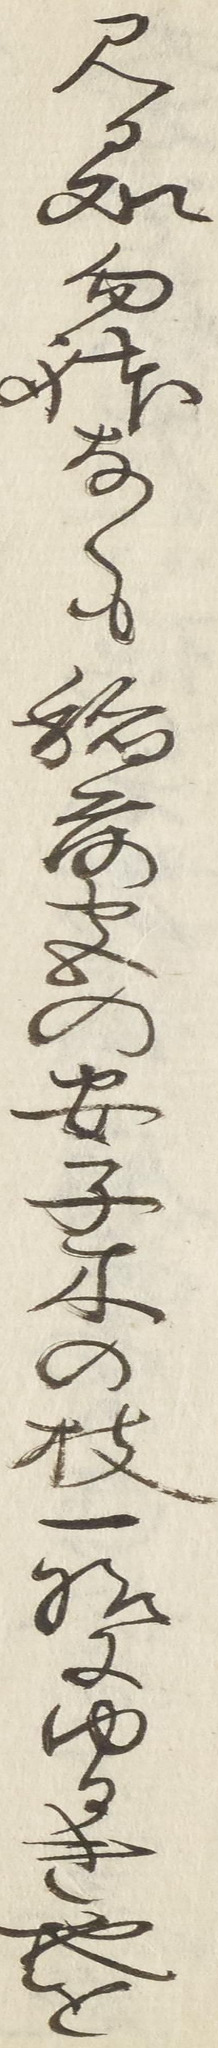見候処勿体なくも稲荷宮の安子木の枝一様にゆるき地を
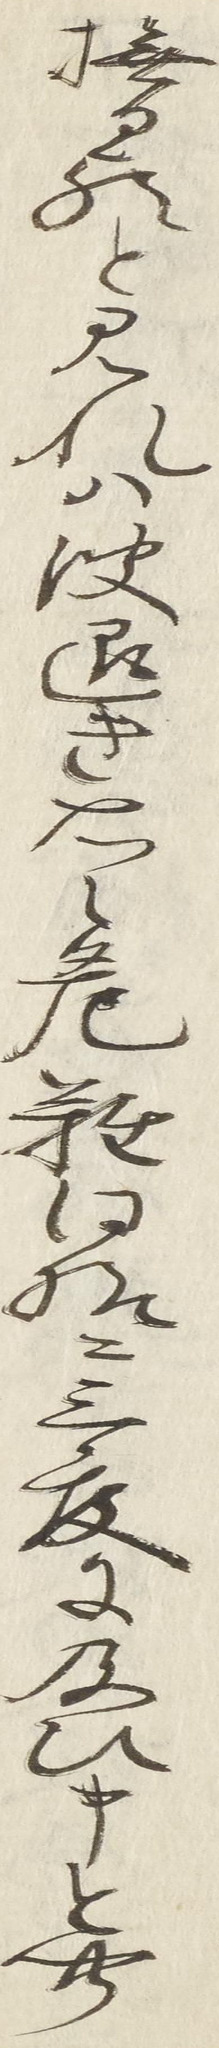撫る歟と見れは波退き右之危難同様に三度に及ひ申と聞
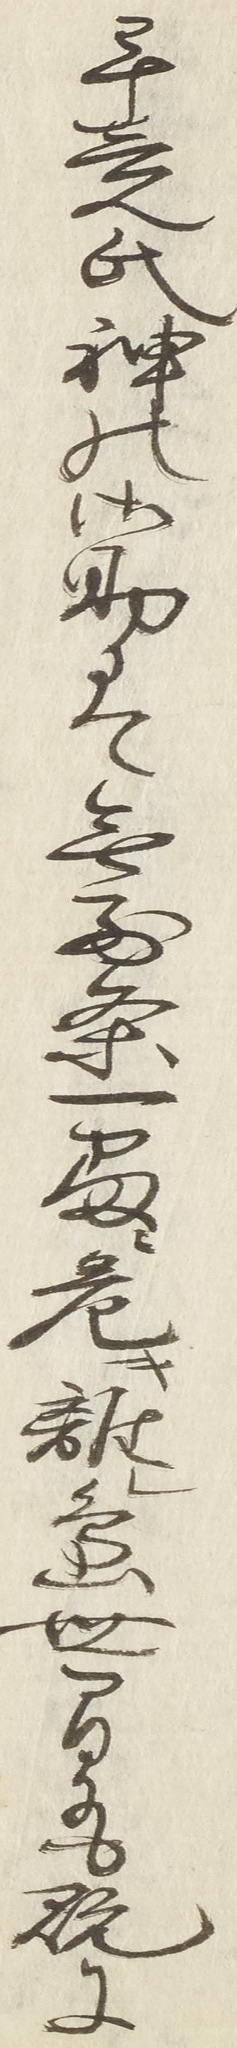畢竟氏神の御助にて無別条一番に危キ離ㇾ嶋世間にも既に
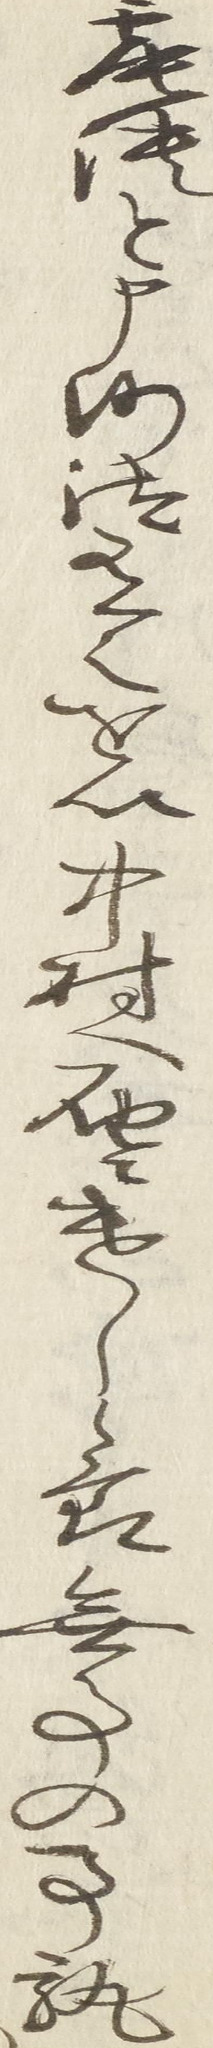震潰と申沙汰有之を以中村へ届に遣し候節無事之の事孰も
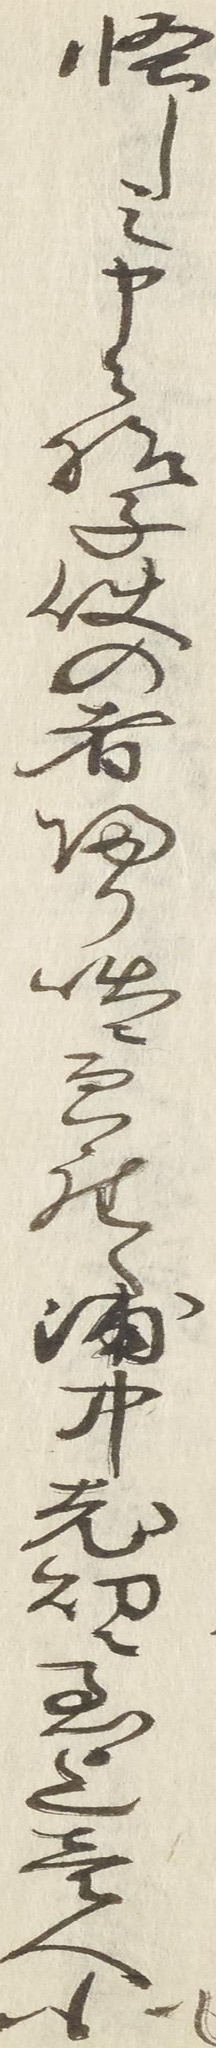怪しみ申候様子使の者帰り咄二而往々浦中老幼二至迄壱人も
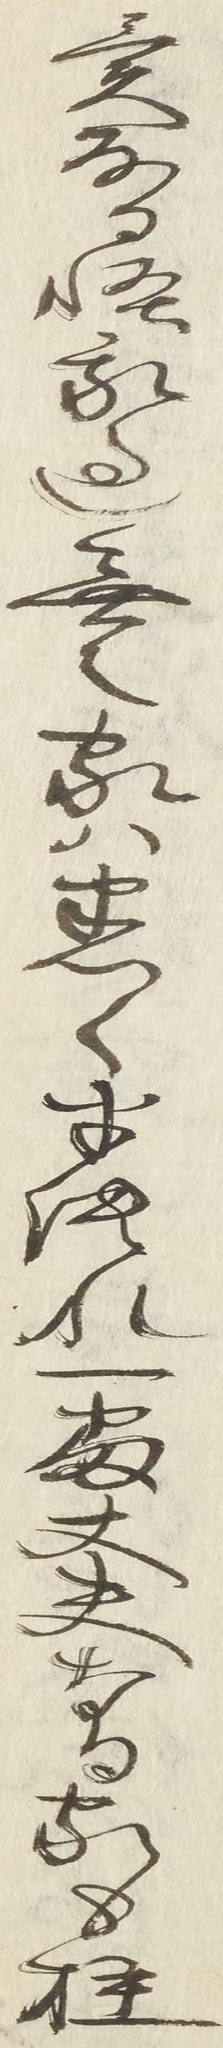実なる怪我迄無之家は悉く半潰れ一番丈夫なる家も柱
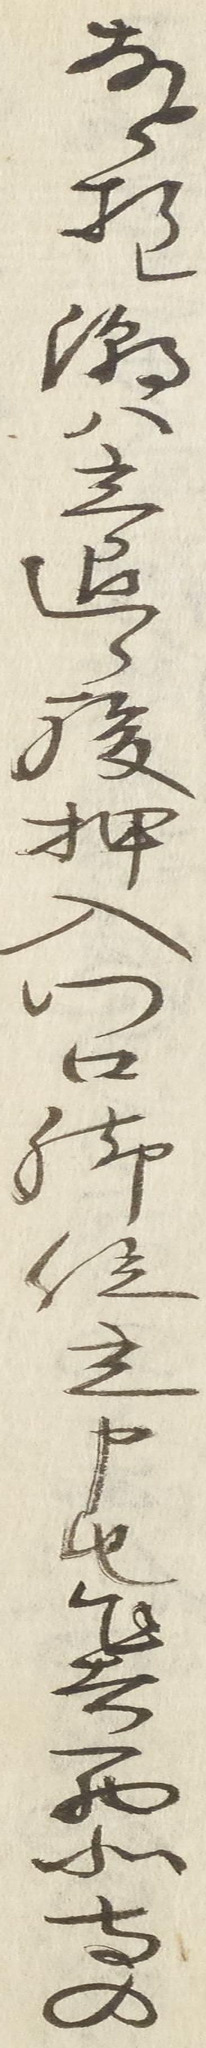なと折ㇾ潮は立追候後押入門口脚位立申哉乍去西北寺の
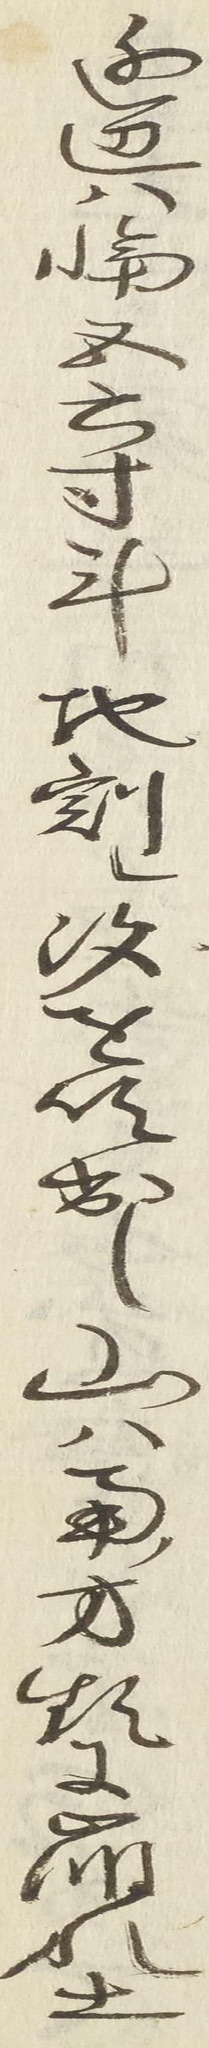近辺は幅五六寸斗地割ㇾ汐を吹出し山は南ノ方頻に崩れ土
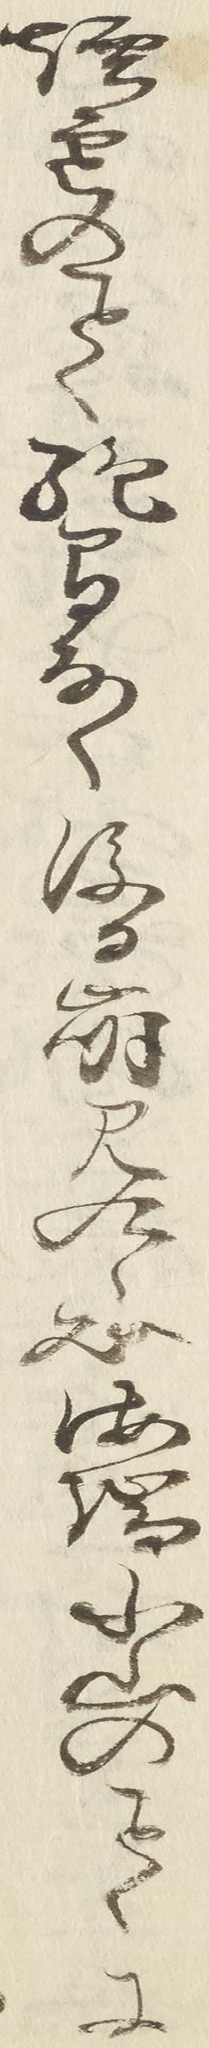煙雲のことく絶間なく終日崩見合候処海端小山のことくに
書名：地震記　下
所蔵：東京大学地震研究所図書室 Earthquake Research Institute Library, The University of Tokyo, JAPAN
